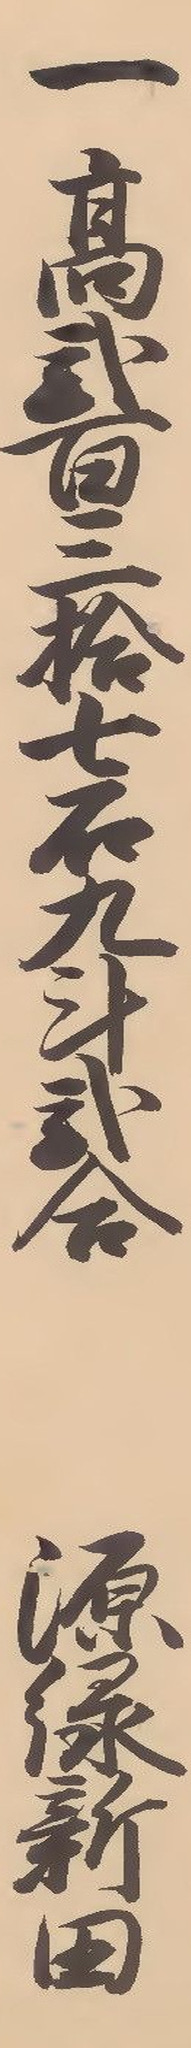一高弐百三拾七石九斗弐合源緑新田

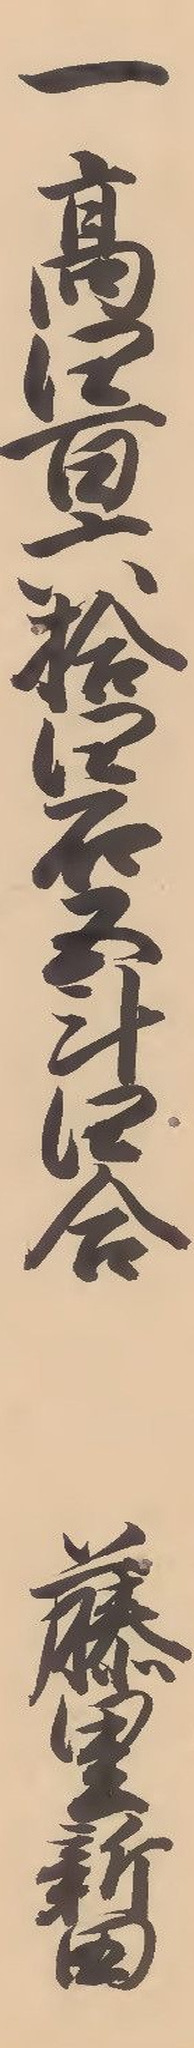一高四百六拾四石五斗四合藤里新田
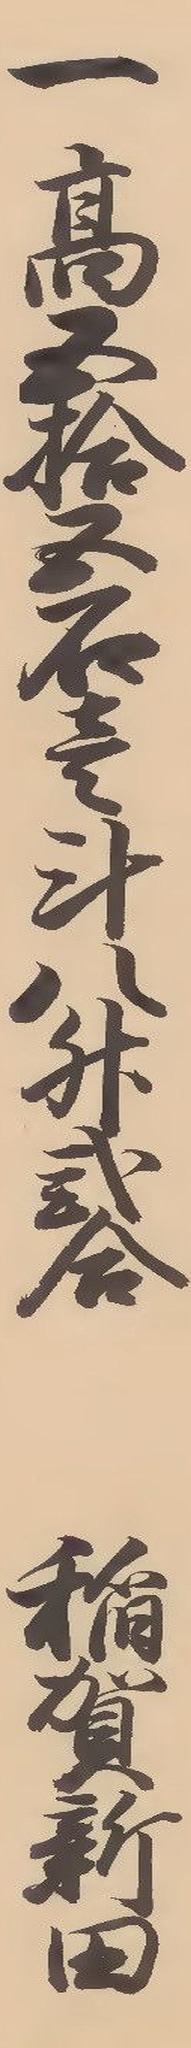一高五拾五石壱斗八升弐合稲賀新田
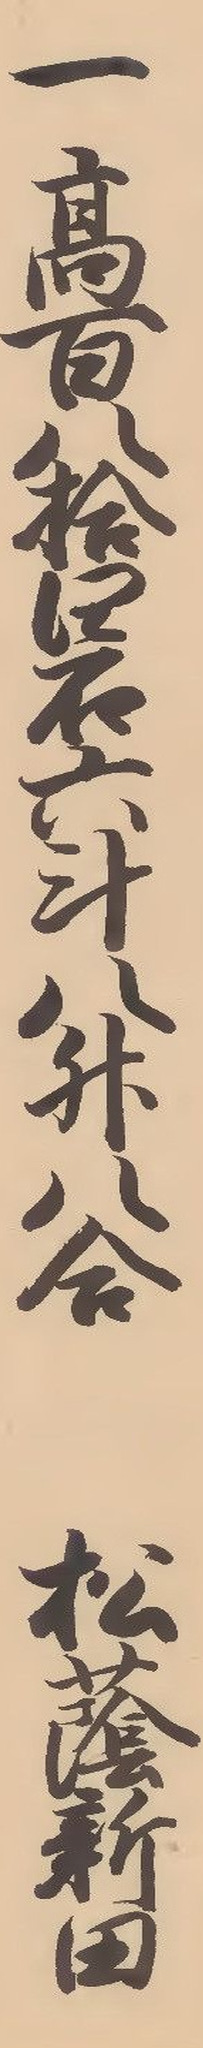一高百八拾四石六斗八升八合松䕃新田
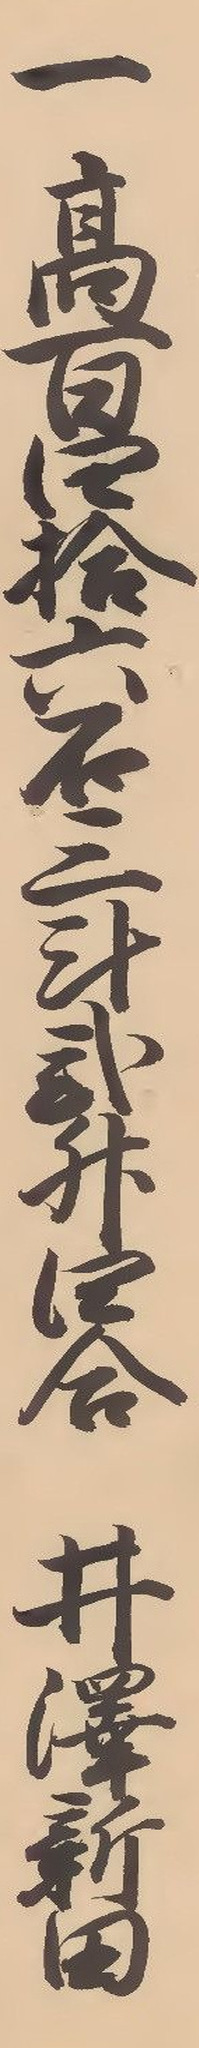一高百四拾六石三斗弐升四合井沢新田
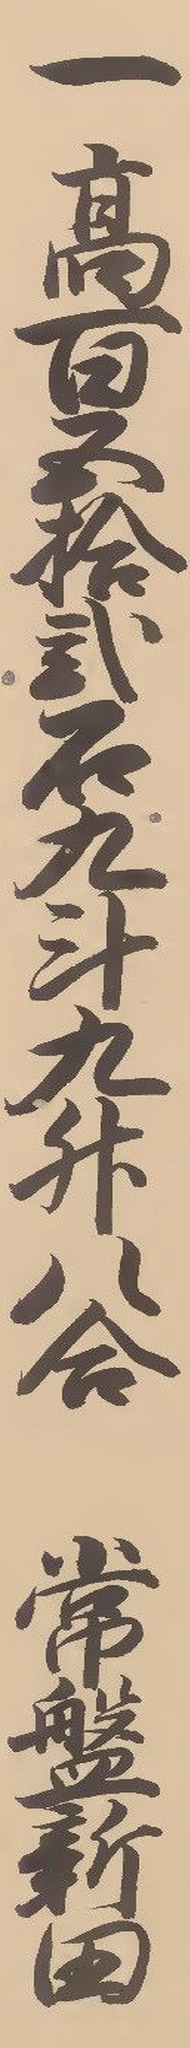一高百五拾弐石九斗九升八合常盤新田
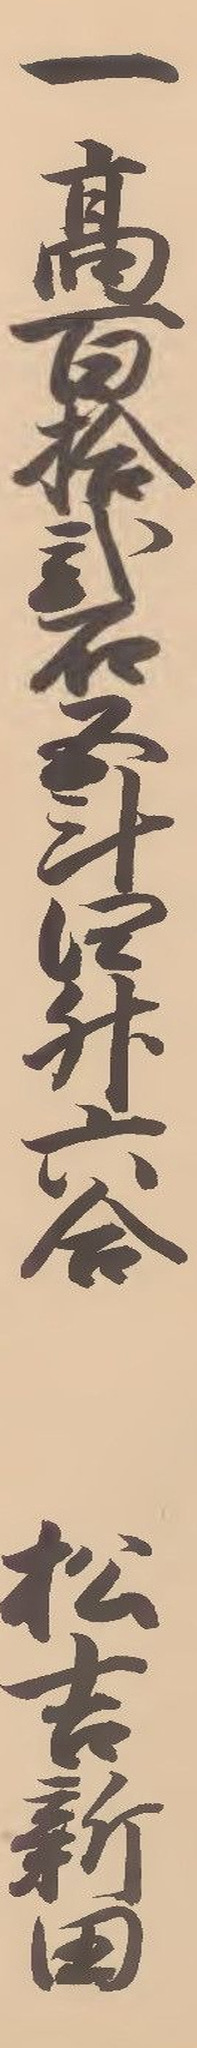一高百拾弐石五斗四升六合松吉新田
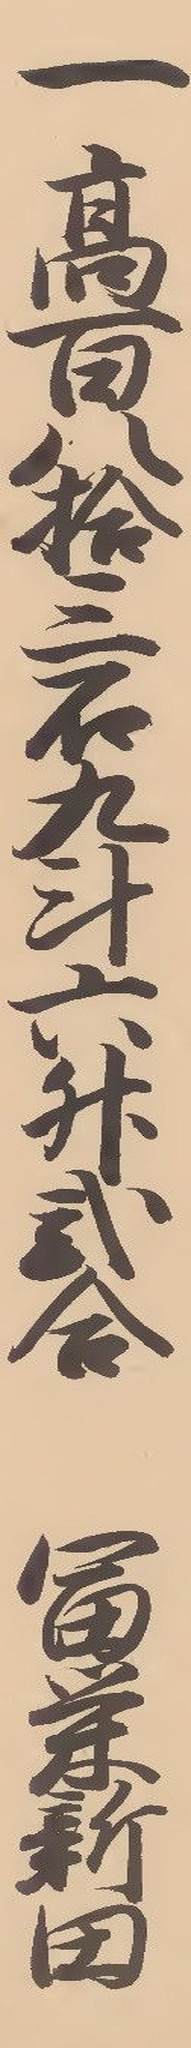一高百八拾三石九斗六升弐合富栄新田
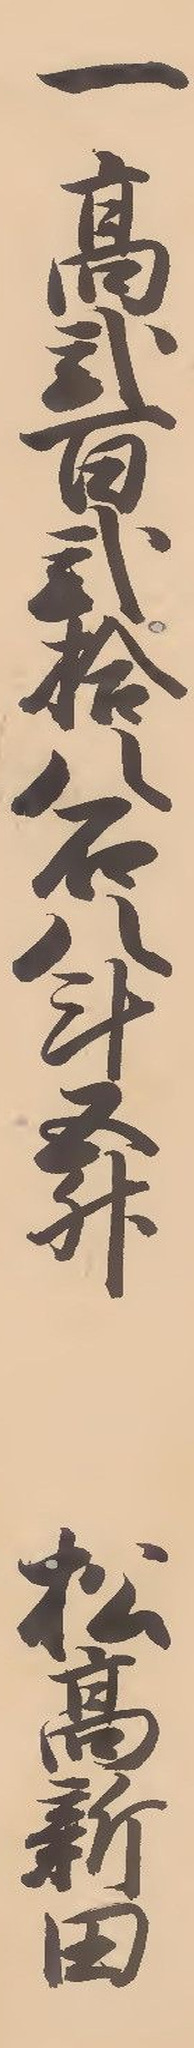一高弐百弐拾八石八斗五升松高新田

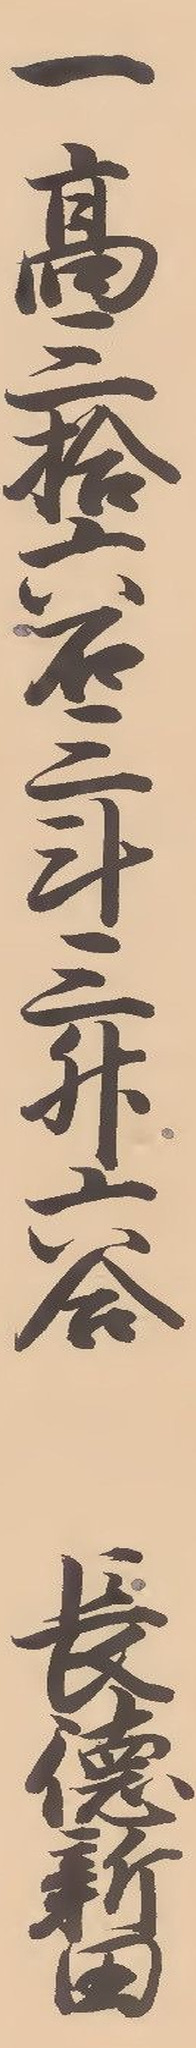一高三拾六石三斗三升六合長徳新田
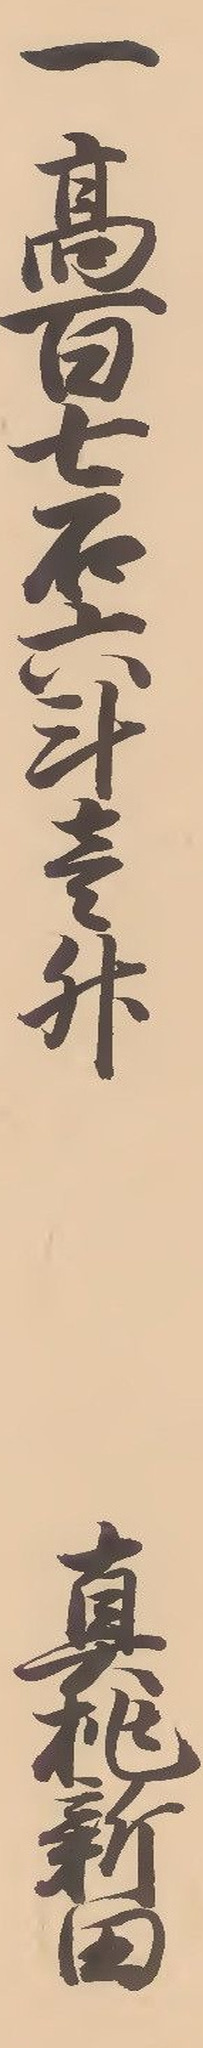一高百七石六斗壱升真挑新田
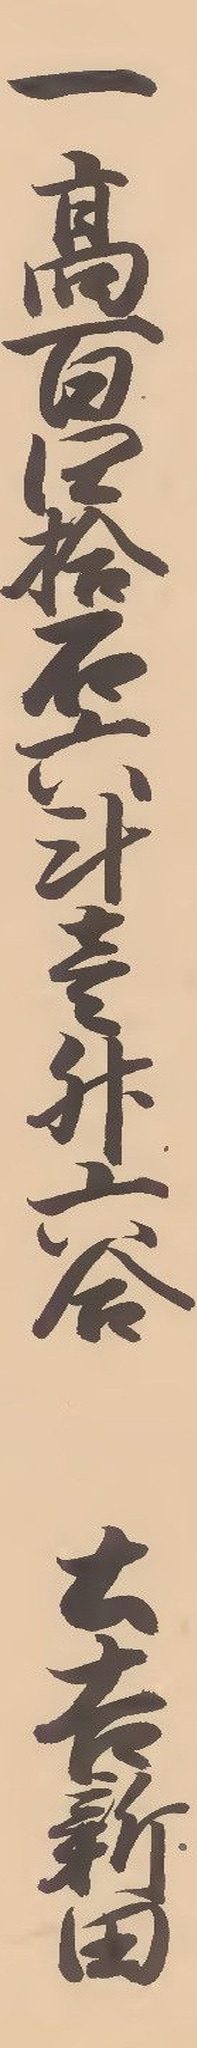一高百四拾石六斗壱升六合土吉新田
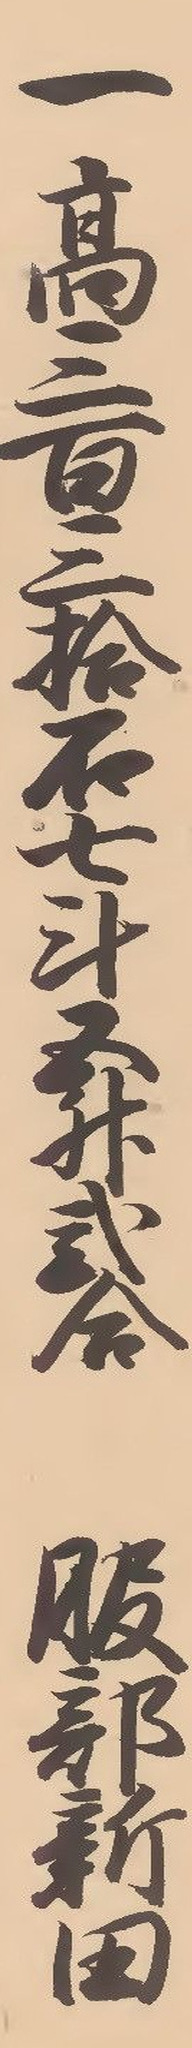一高三百三拾石七斗五升弐合服部新田
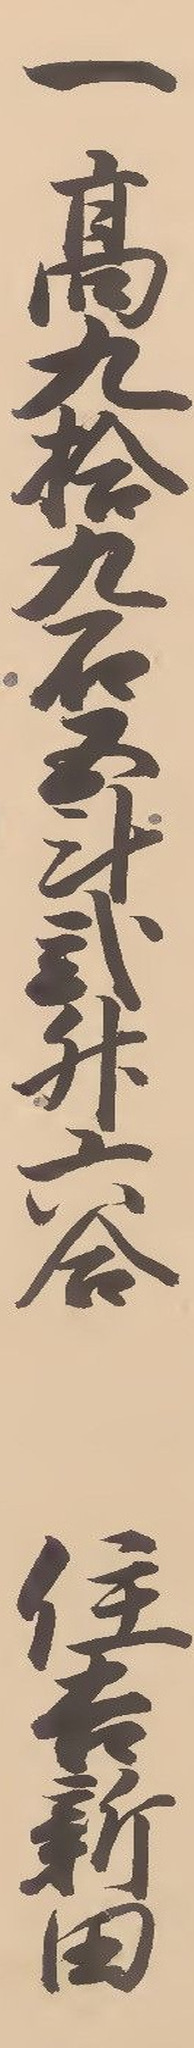一高九拾九石五斗弐升六合住吉新田
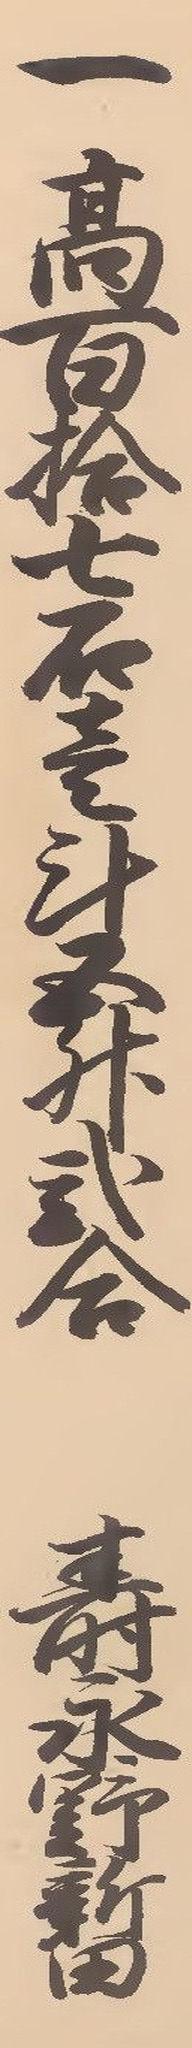一高百拾七石壱斗五升弐合寿永野新田
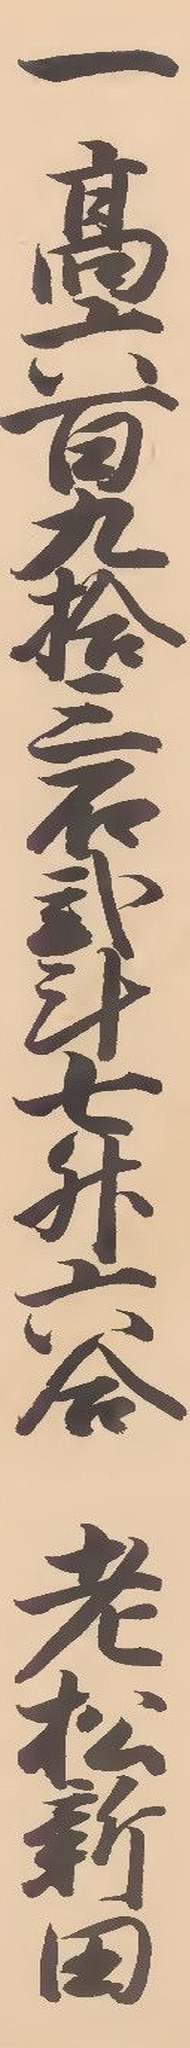一高六百九拾三石弐斗七升六合老松新田
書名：伊勢国郷帳
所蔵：国立公文書館 National Archives of Japan
